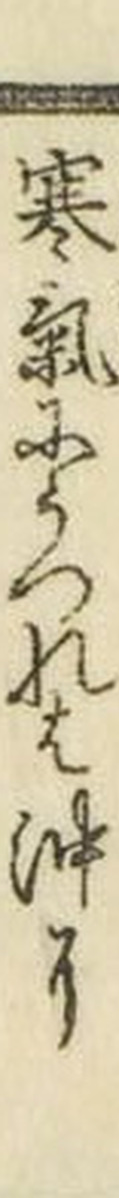寒気にうつれは沖に
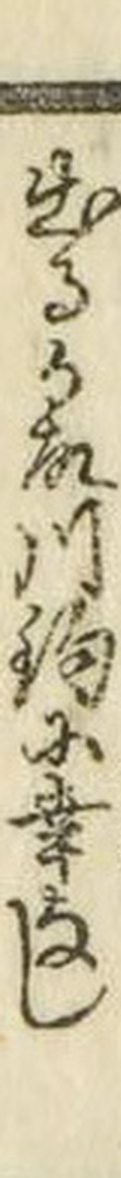出るか故川釣に幸なし
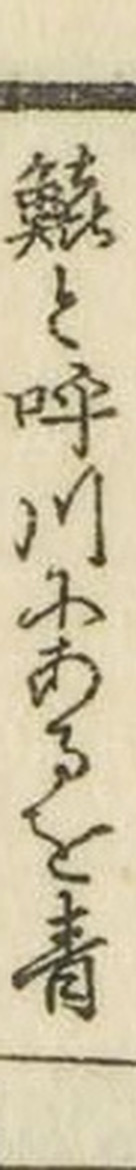鱚と呼川にあるを青
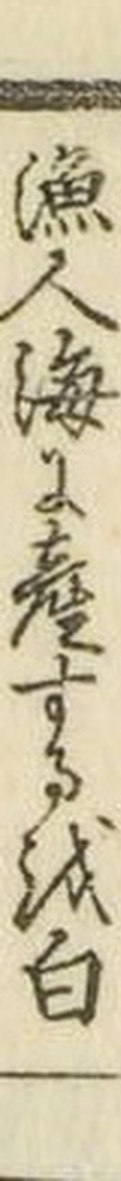漁人海に産するを白
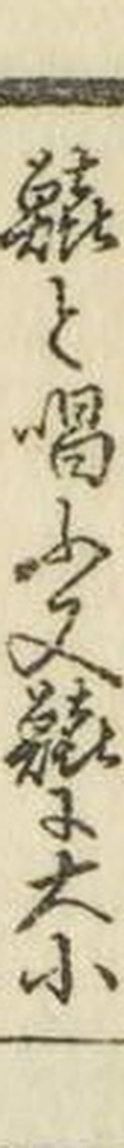鱚と唱ふ又鱚に大小
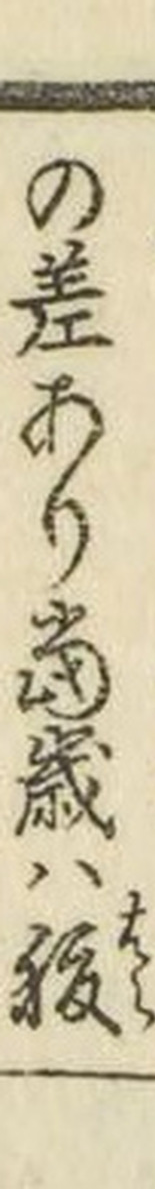の差あり當歳は腹
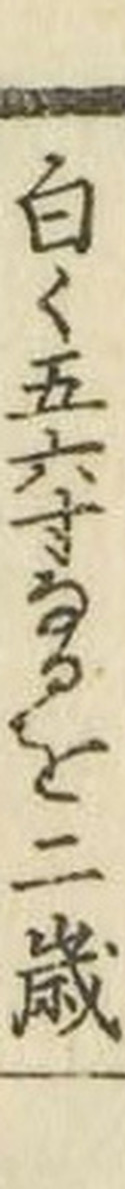白く五六寸なるを二歳
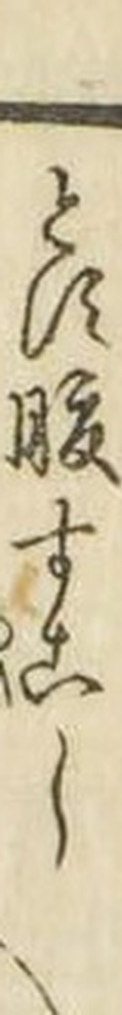とす腹すこし
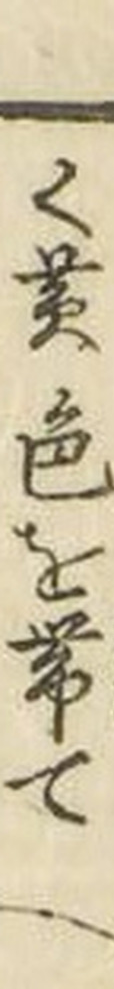く黄色を帯て
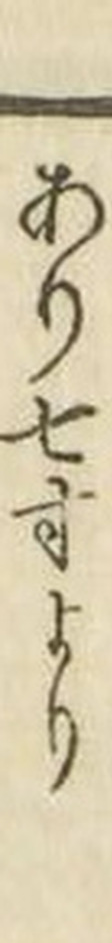あり七寸より
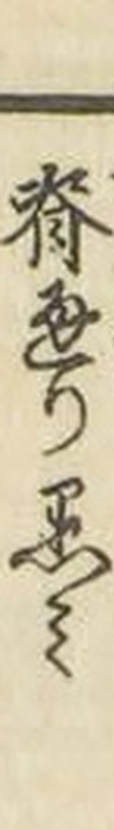背通り黒み
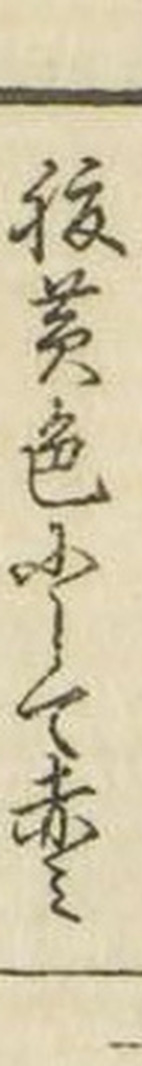腹黄色にして赤み
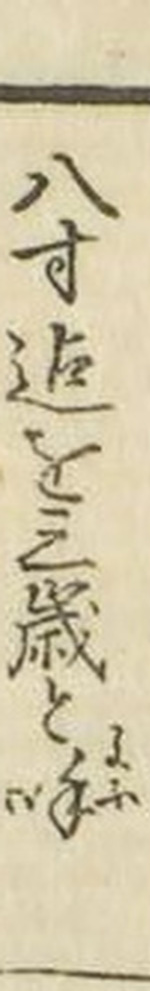八寸迄を三歳と呼
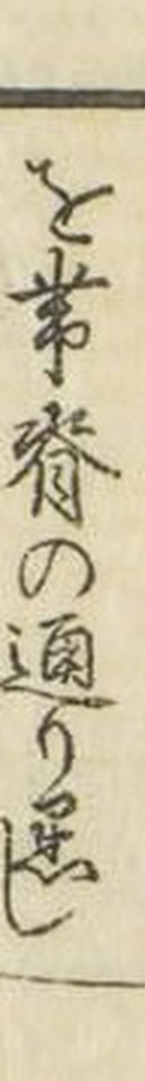を帯背の通り黒し
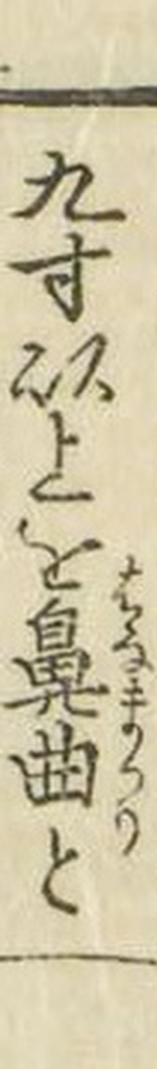九寸以上を鼻曲と
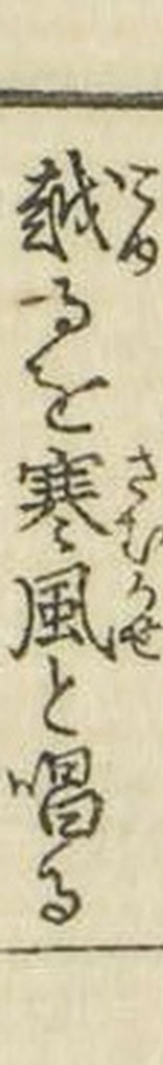越るを寒風と唱る
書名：江戸名所図会 20巻 巻之19
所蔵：東京学芸大学教育コンテンツアーカイブ
